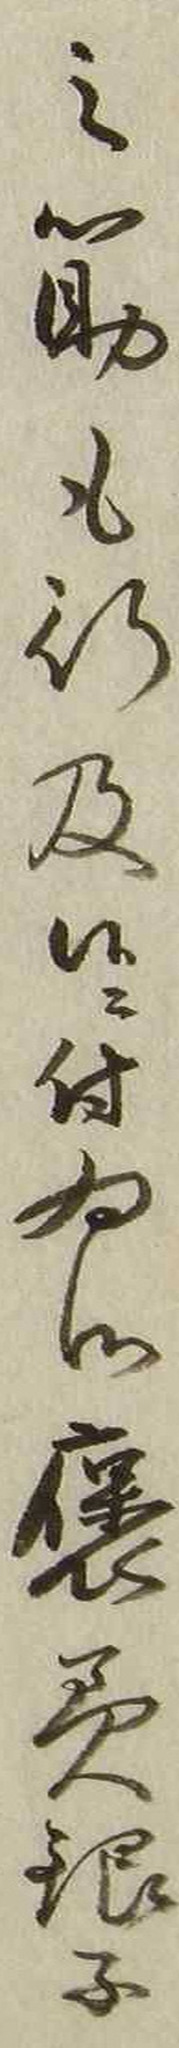之筋も行及候ニ付為御褒美銀子
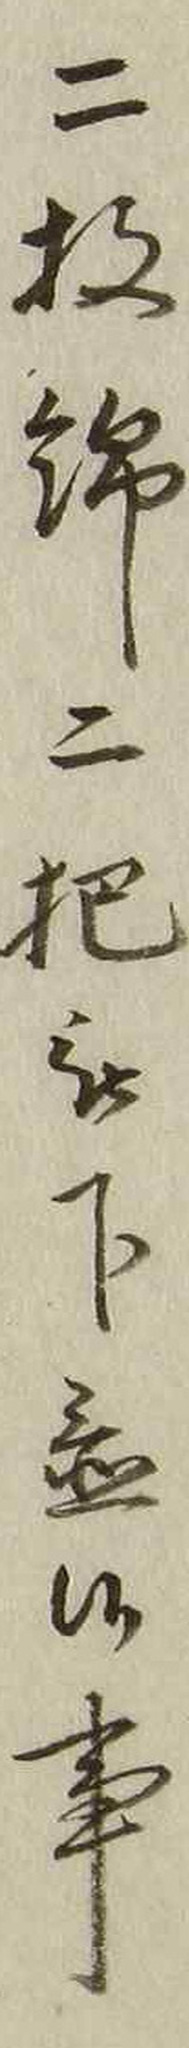二枚綿二把被下置候事
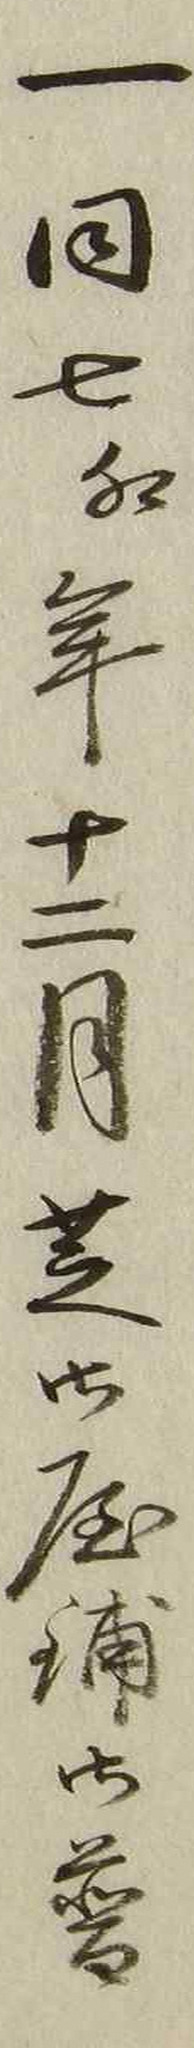一同七卯年十二月芝御屋鋪御普
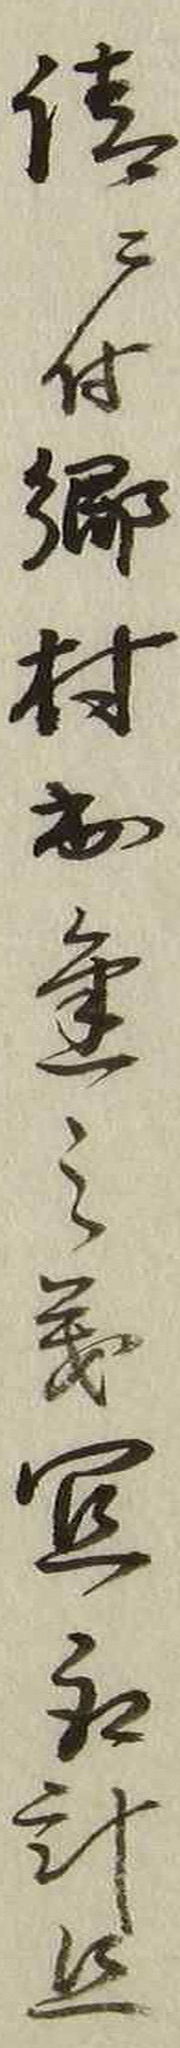請ニ付郷村出金之義宜取計且
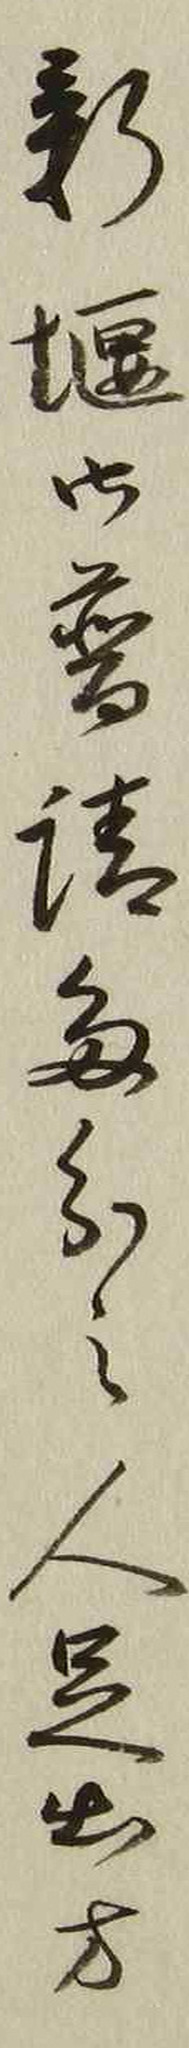新堰御普請多分之人足出方
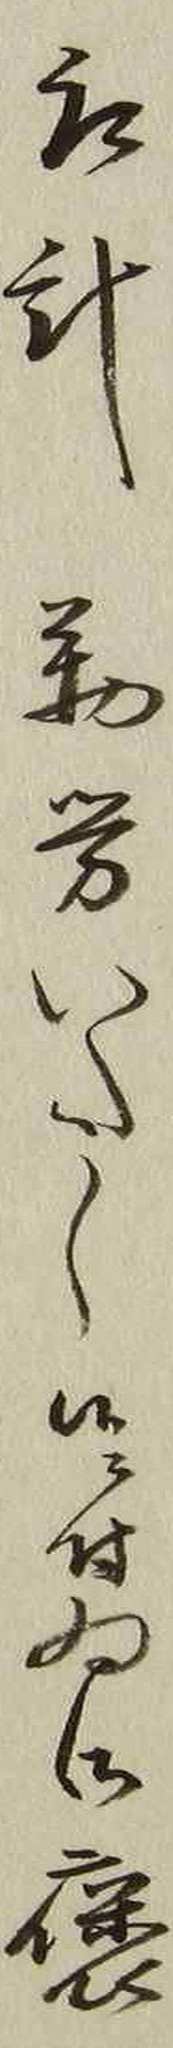取計勤労いたし候ニ付為御褒
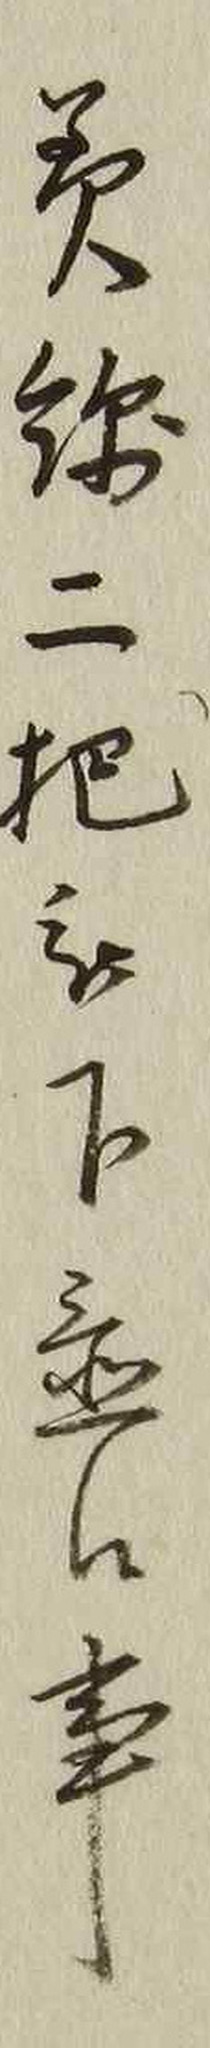美綿二把被下置候事
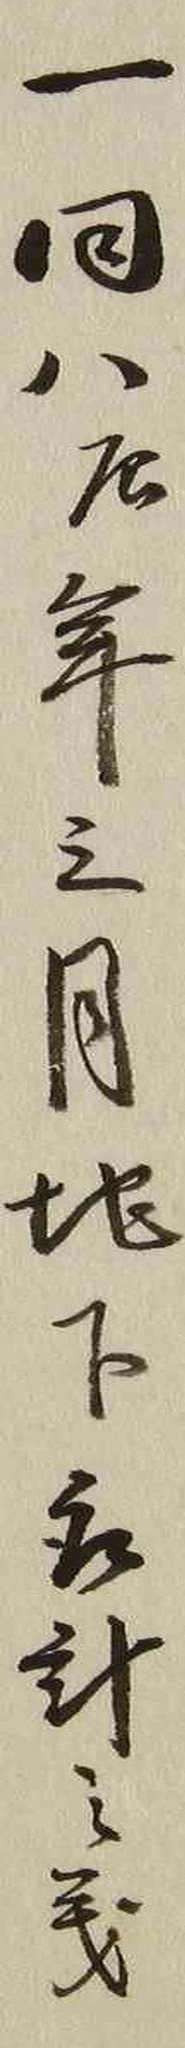一同八辰年三月地下取計之義
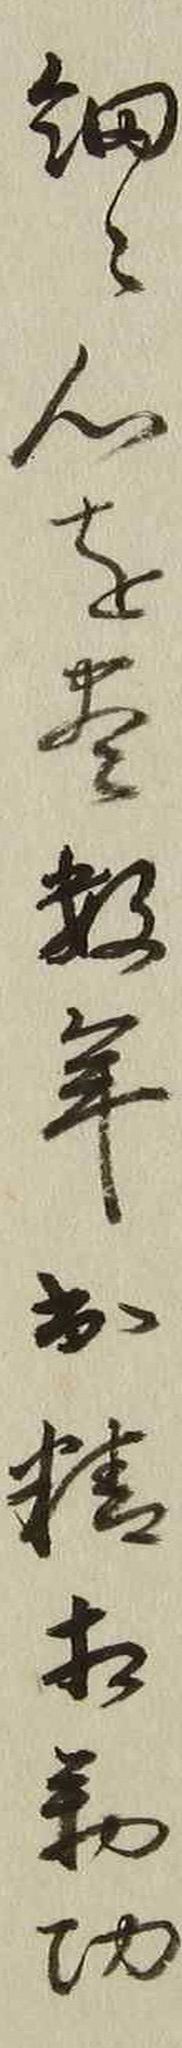細々心を尽数年出精相勤功
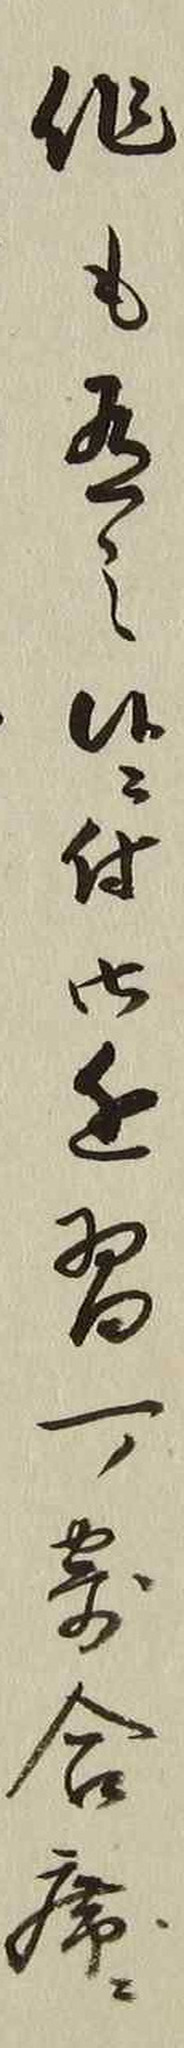他も有之候ニ付御近習一ノ寄合席ニ
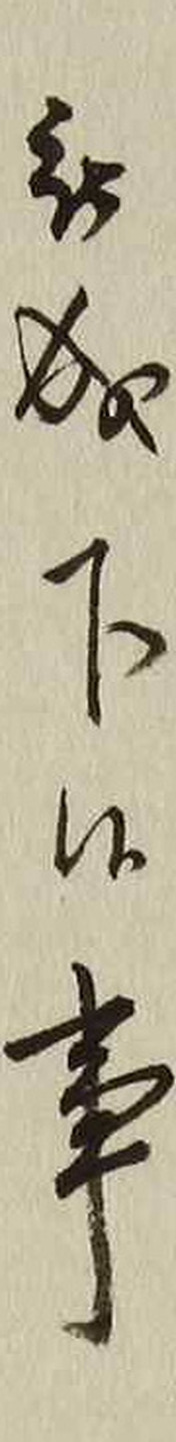被成下候事
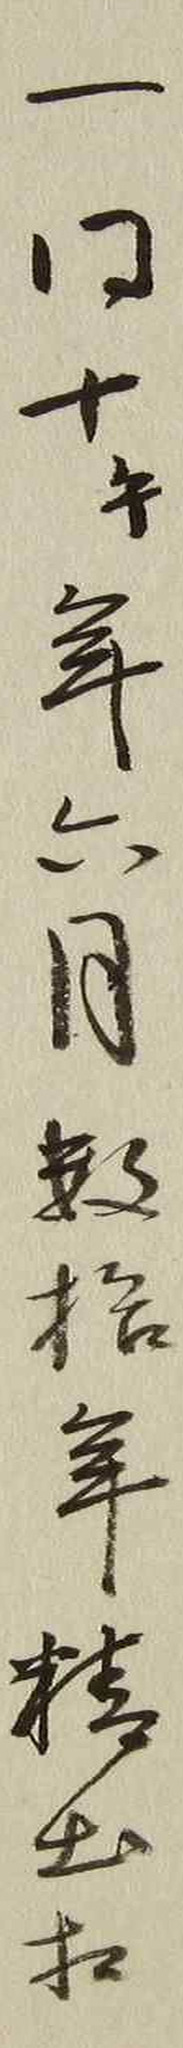一同十午年六月数拾年精出相
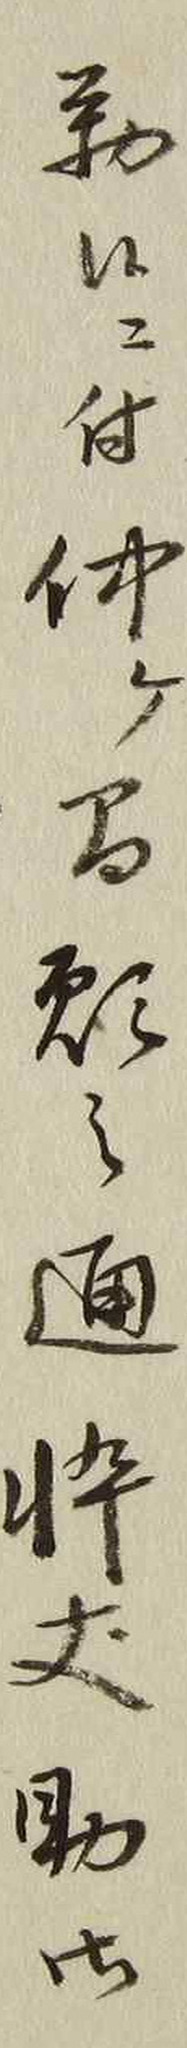勤候ニ付仲ケ間願之通忰丈助御
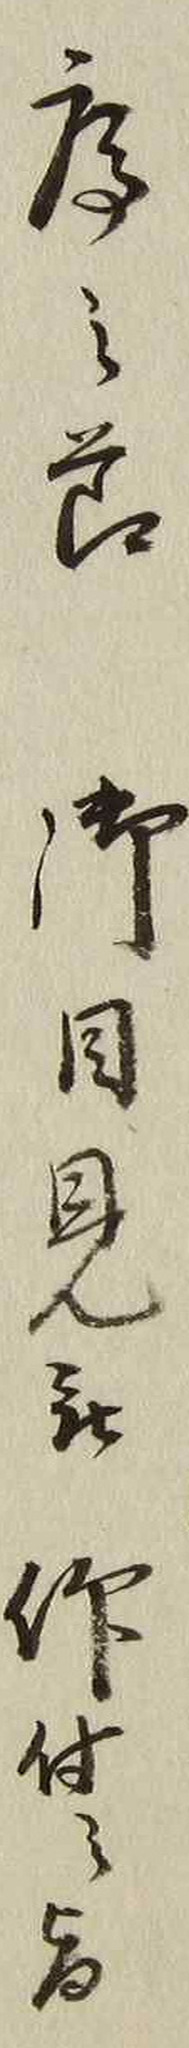序之節御目見被仰付之旨
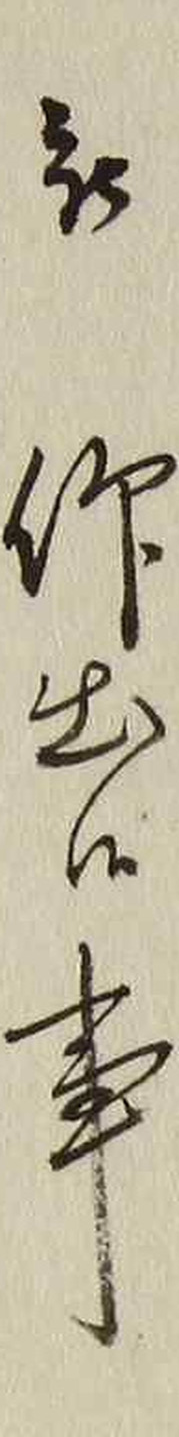被仰出候事
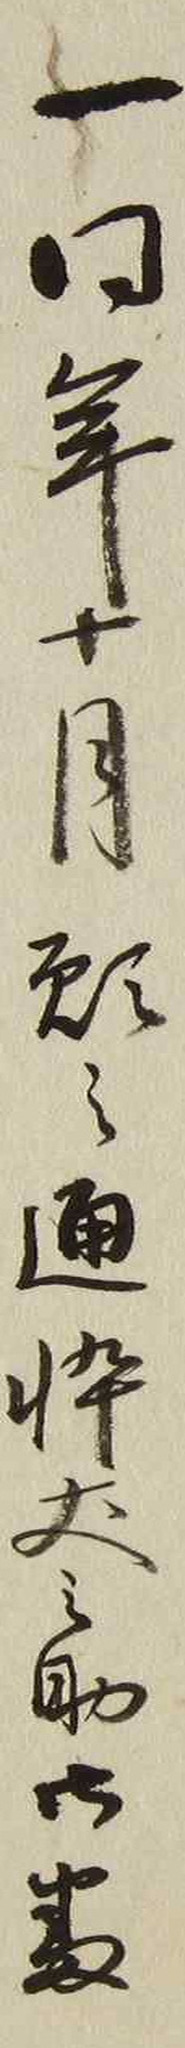一同年十月願之通忰丈之助御番
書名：諸士系譜　巻之149　そ之部2
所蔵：会津若松市立会津図書館
